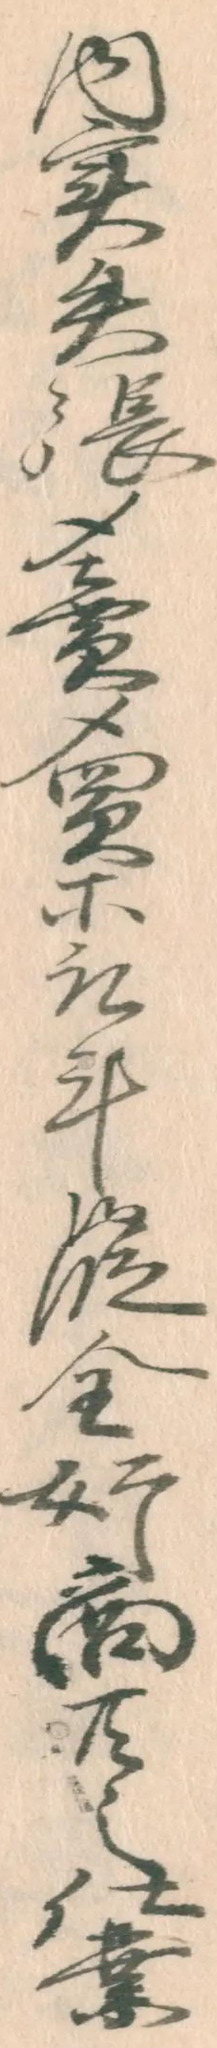内実矢張〆売〆買等取計候段全奸商共之仕業
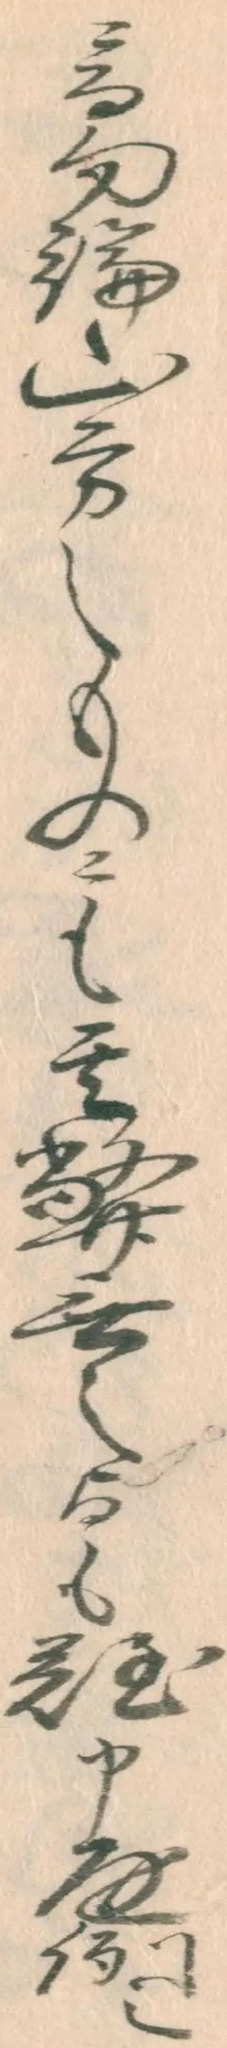ニて勿論山方之ものニも其弊無之とも疑申通例之
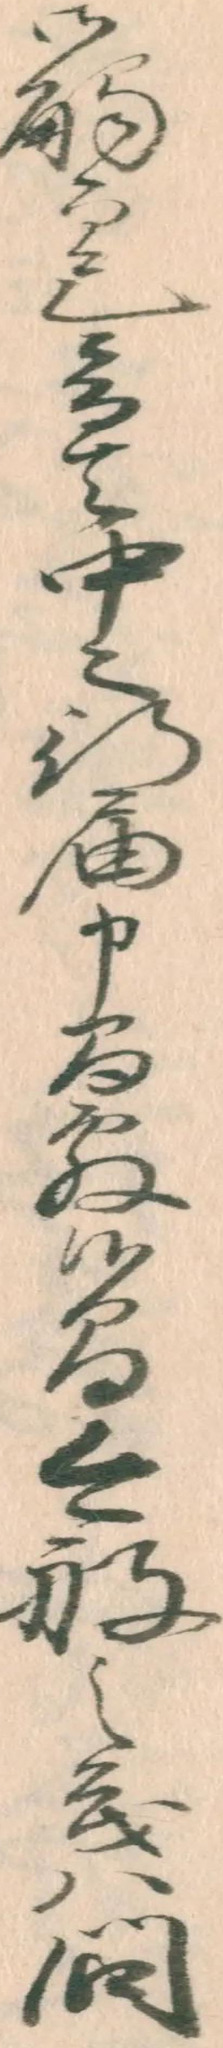御触れ而已ニては中〻行届申間敷候間今般之義ハ問
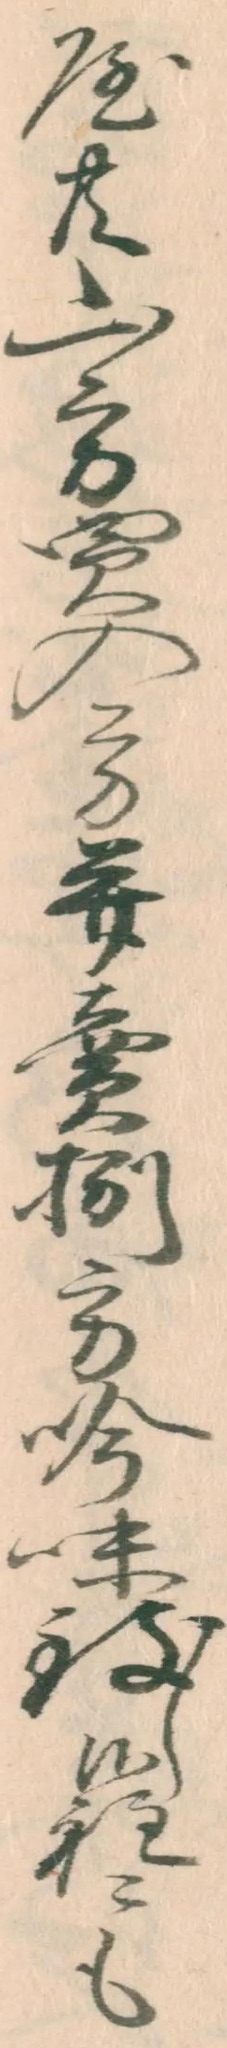屋共山方買入方幷売捌方吟味致し候程ニも
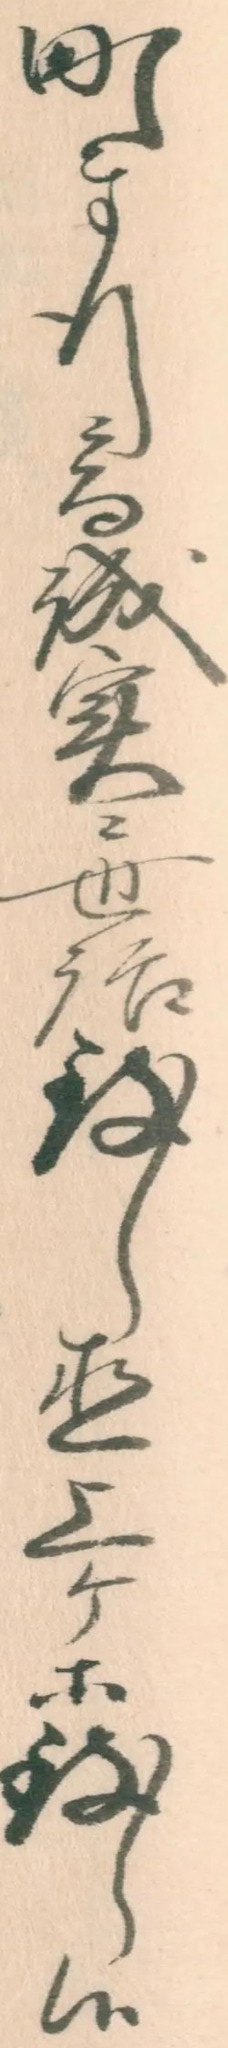町奉行ニて誠実ニ世話致し直上ケ等致し候
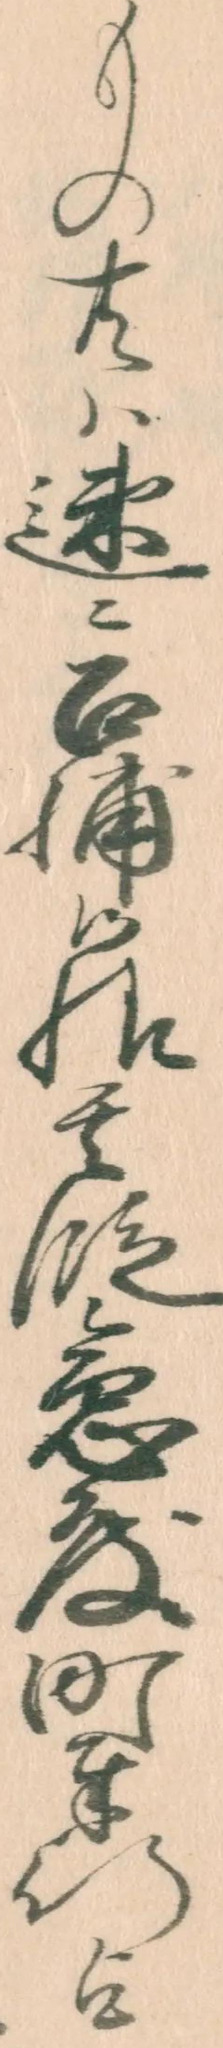もの共は速ニ召捕候様其段急度町奉行え
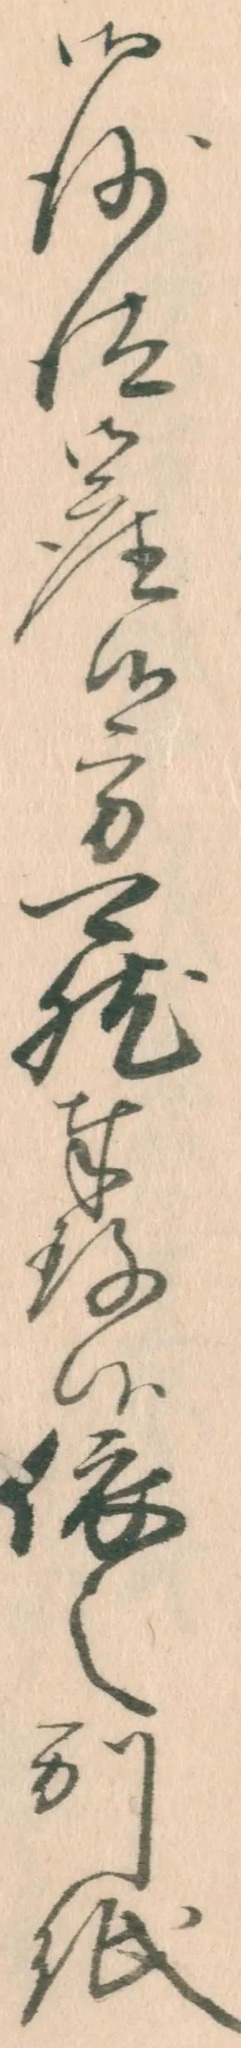御沙汰御座候方可然奉存候依之別紙
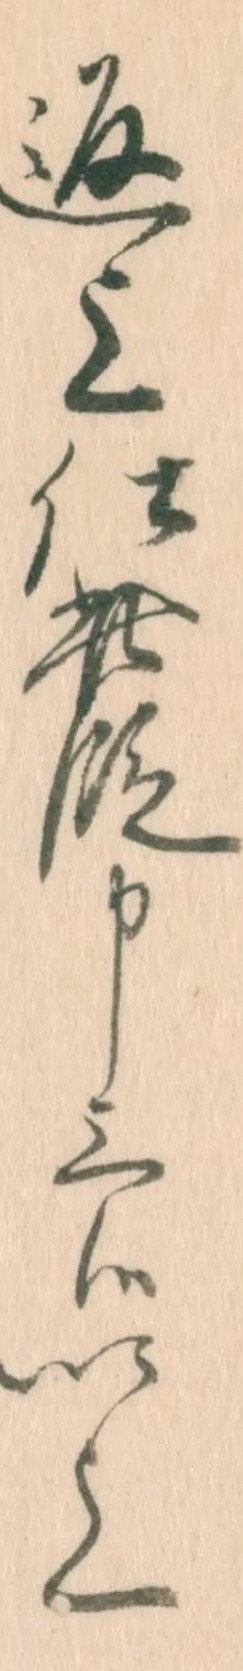返上仕此段申上候以上

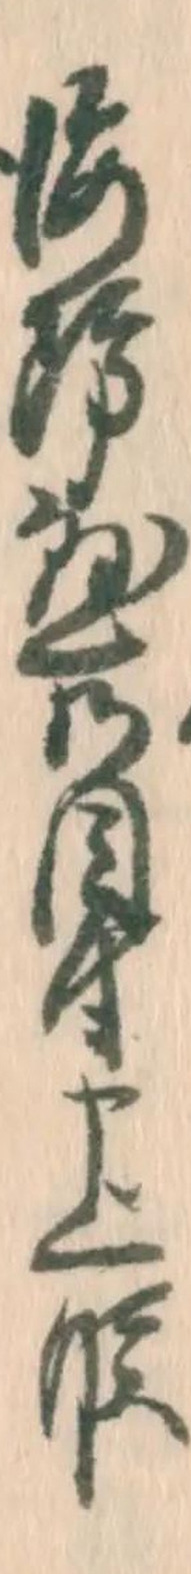│海防懸御目付申上候
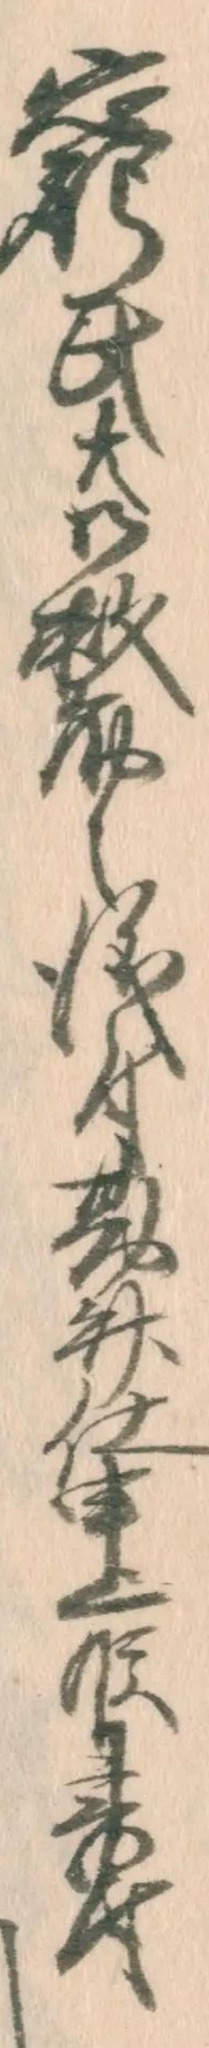│窮民共御救助之儀付勘弁仕申上候書付
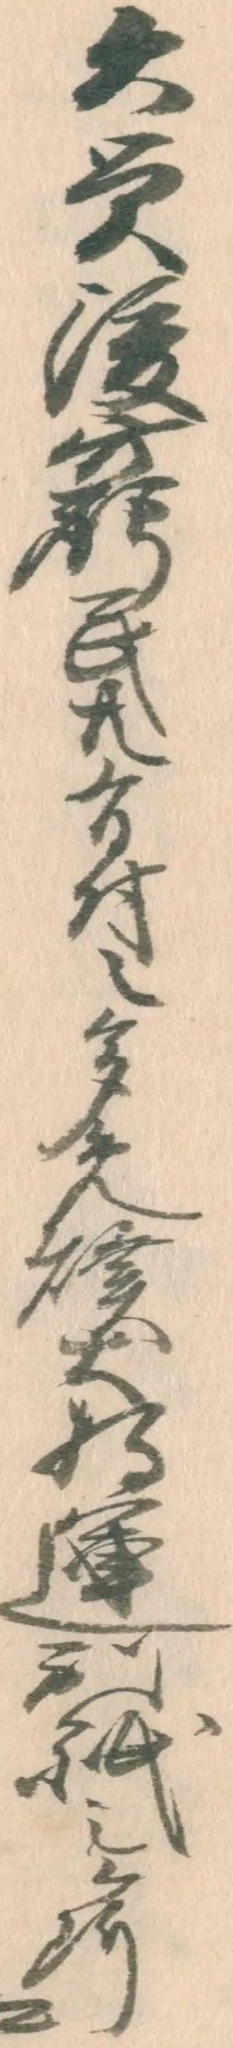大災後窮民共有付之ため焼土持運別紙之ケ所え

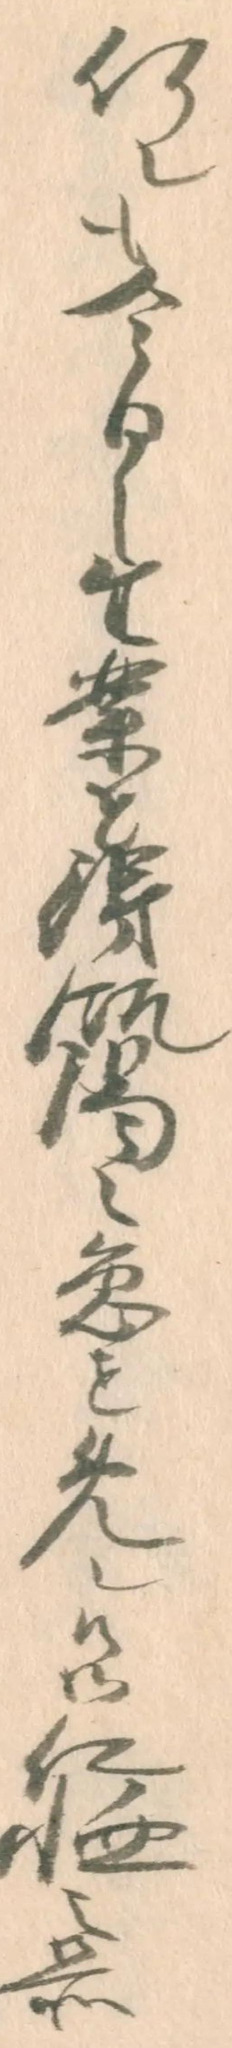何レも今日之生業を得飢渇乃急を免レ候御仁恤之御所
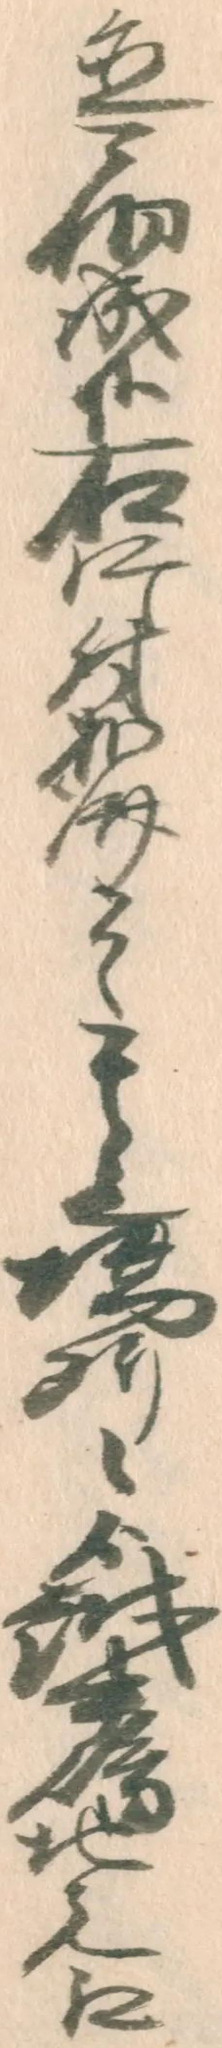置ニ相成候右片付相済候ハヽ其上場所〻ゟ越中島地先え
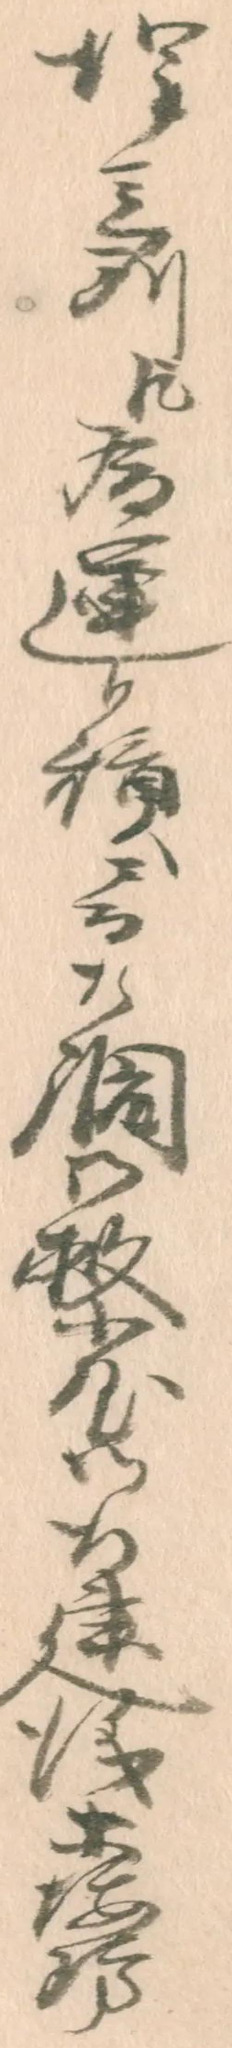埋立所え為運候積ニて取調御救小屋御取建儀等海防
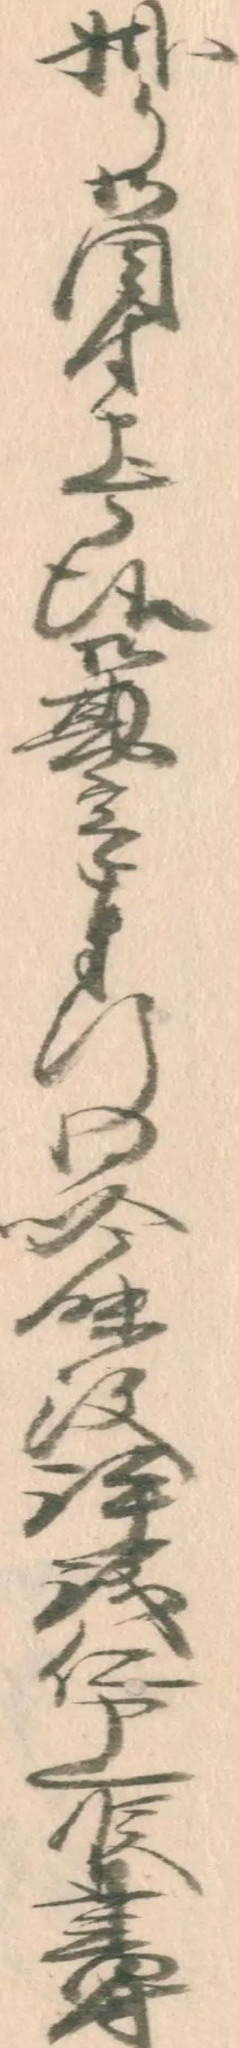掛り御目付申上候趣御勘定奉行同吟味役評議仕申上候御書付
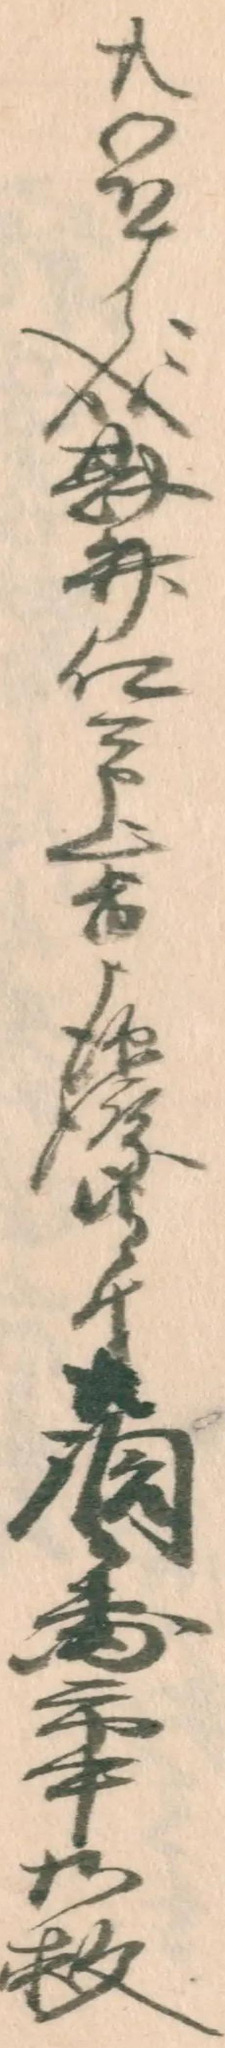共御下被成勘弁仕可申上旨被仰渡候ニ付取調候処市中御救
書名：地震災書留 2巻. [2] 内表紙に「地震一件　安政二卯年十月」とあり
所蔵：国立国会図書館 National Diet Library, JAPAN
